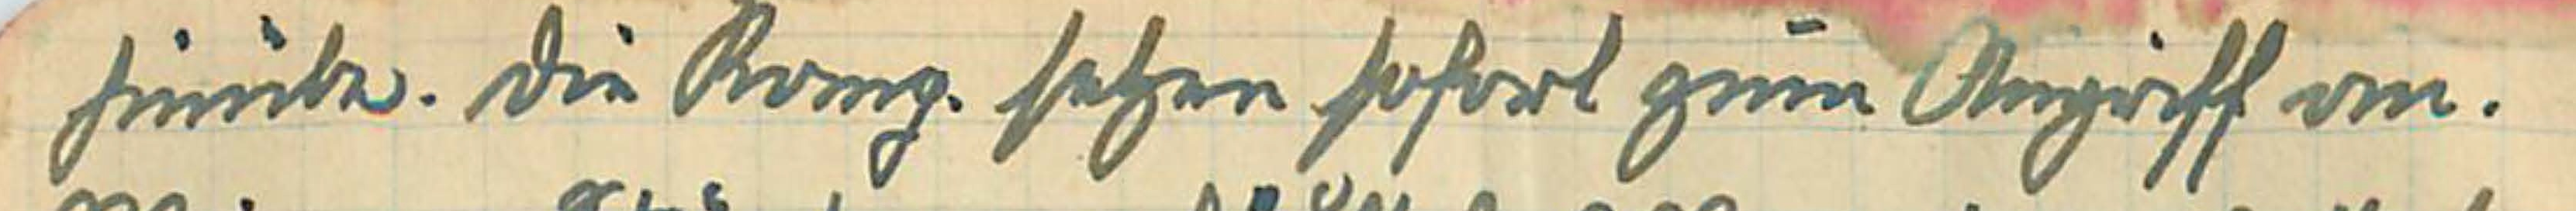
hinüber. Die Komp. setzen sofort zum Angriff an.
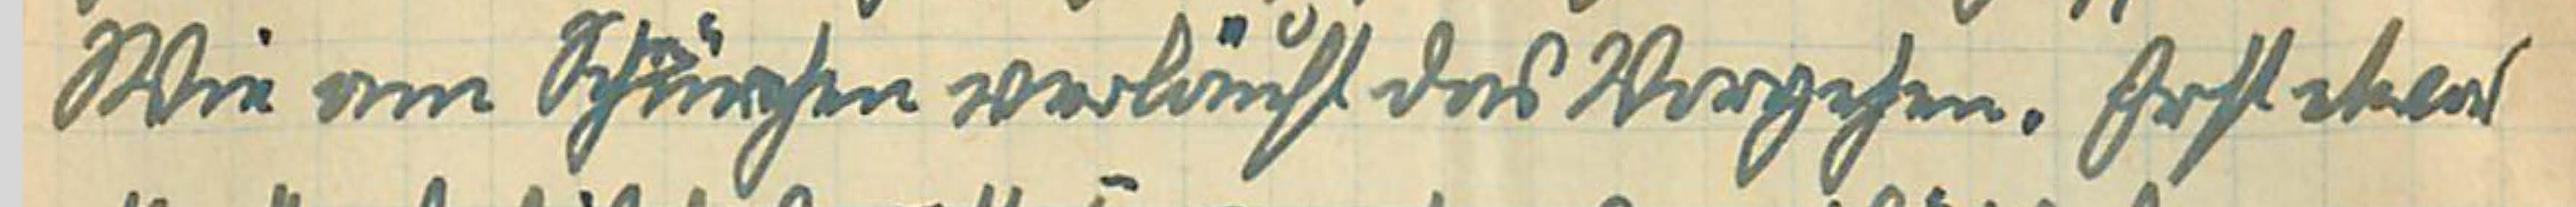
Wie am Schnürchen verläuft das Vorgehen. Erst etwas
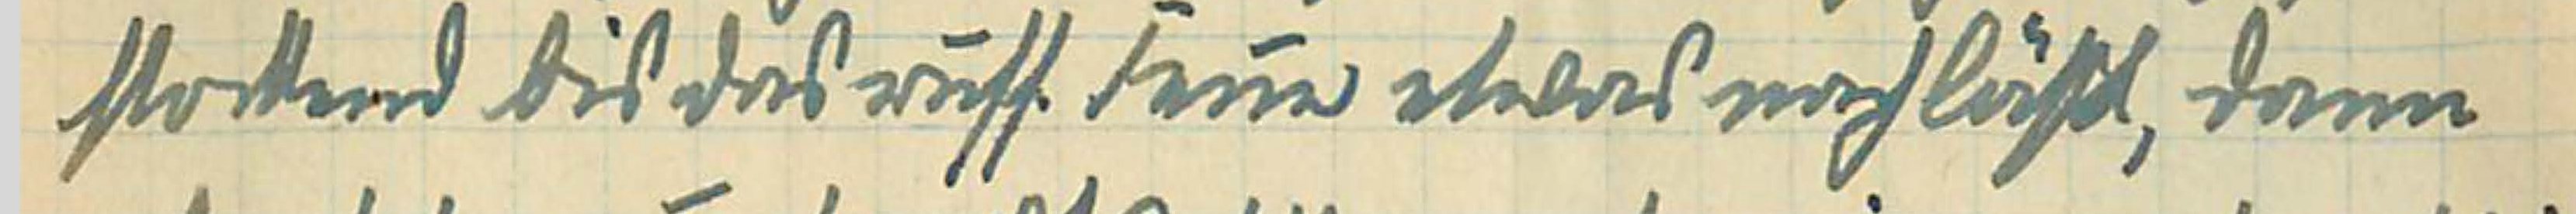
stockend bis das russ. Feuer etwas nachläßt, dann
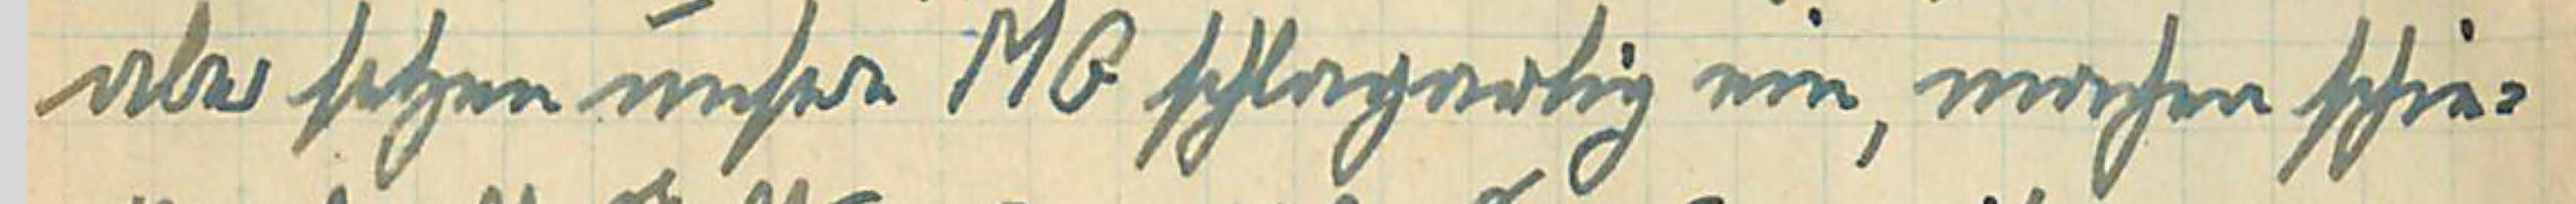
aber setzen unsre MG schlagartig ein, machen schie-
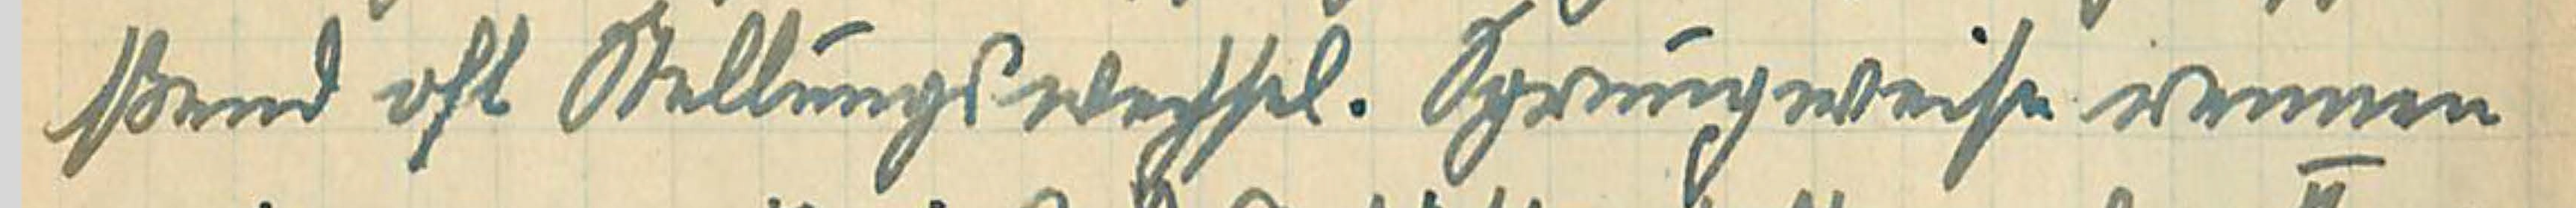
ßend oft Stellungswechsel. Sprungweise rennen
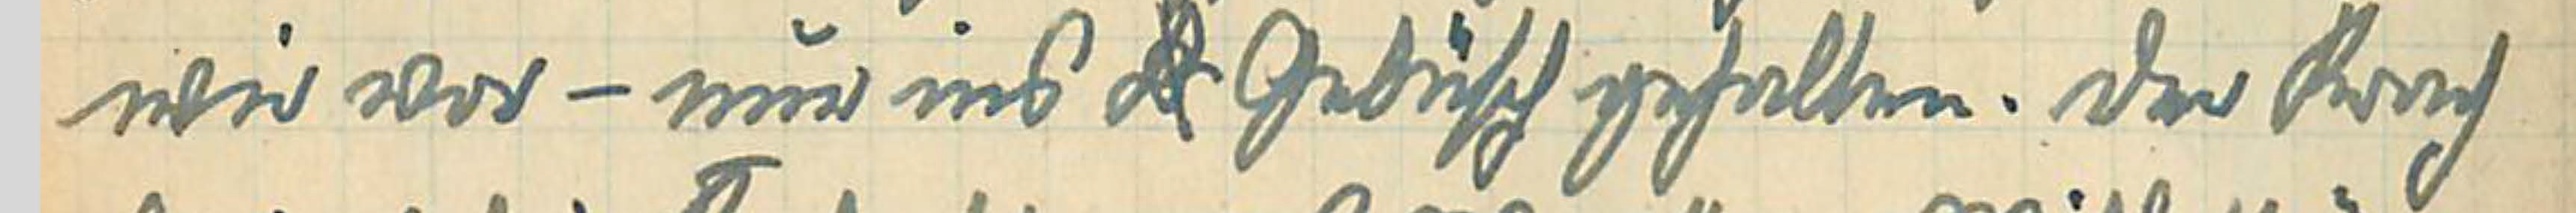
wir vor – nur ins B Gebüsch gehalten. Der Krach
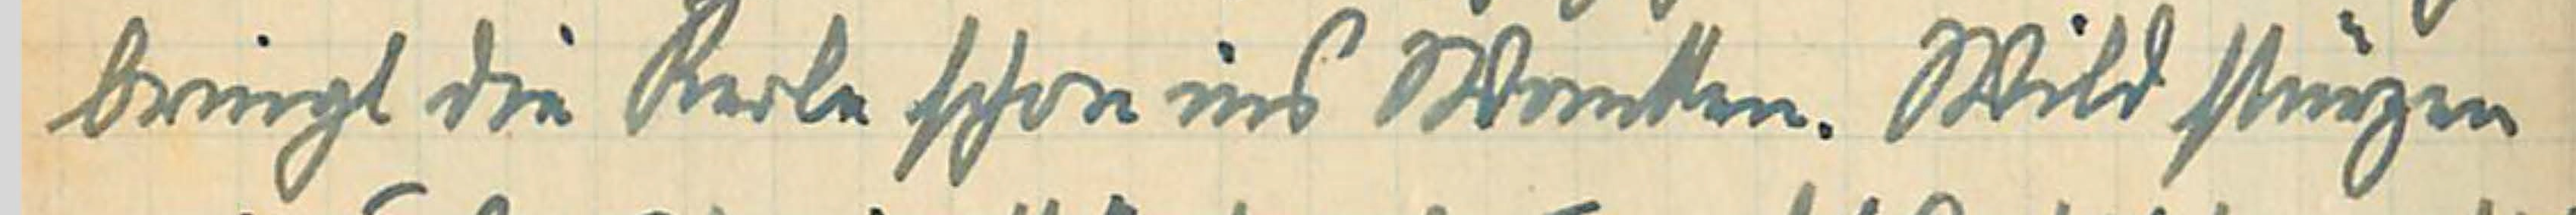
bringt die Kerle schon ins Wanken. Wild stürzen
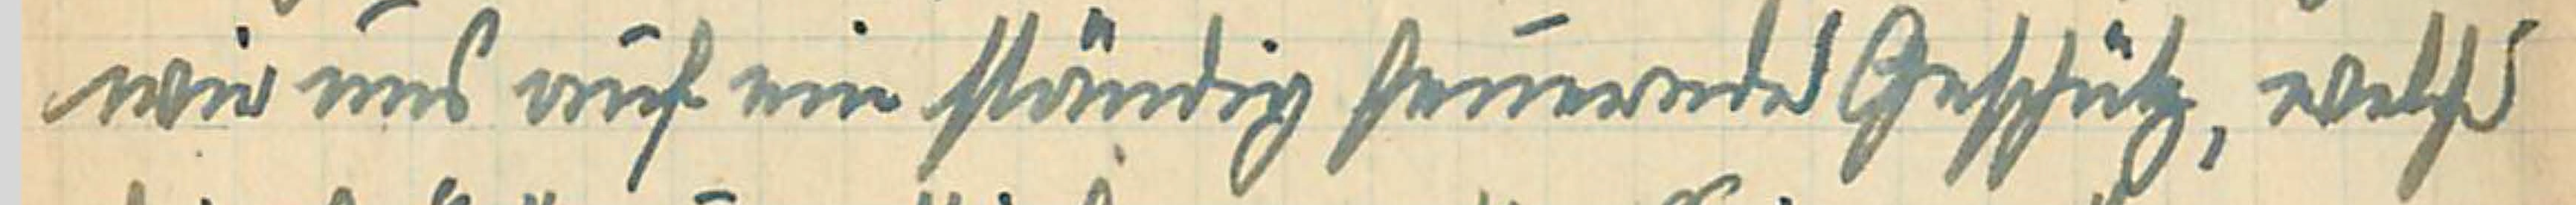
wir uns auf ein ständig feuerndes Geschütz, welches
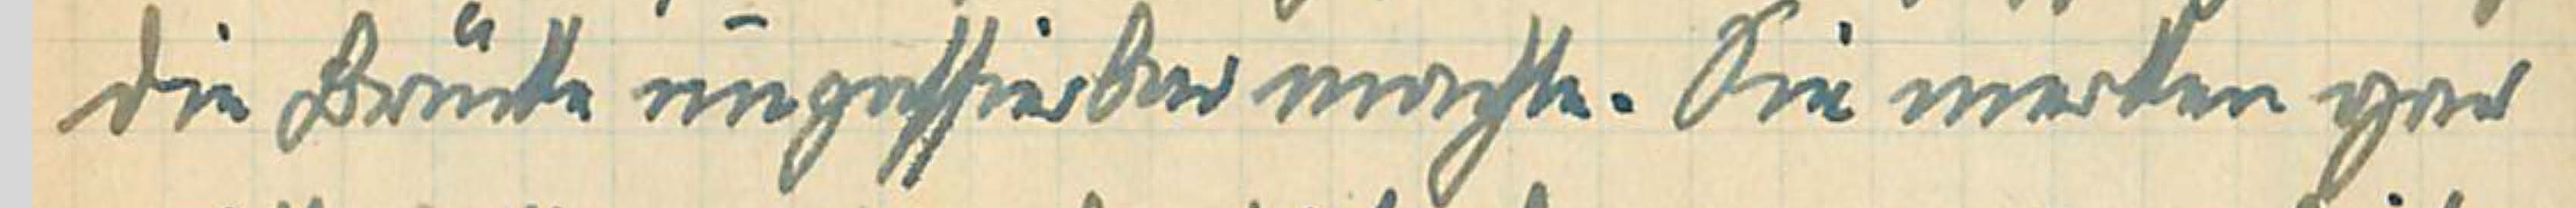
die Brücke unpassierbar machte. Sie merken gar
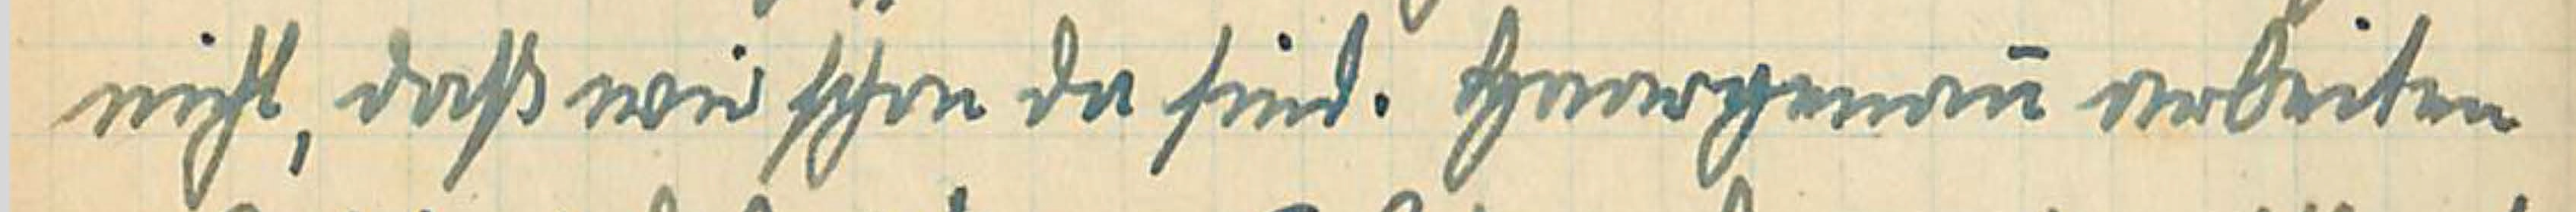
nicht, daß wir schon da sind. Haargenau arbeiten
